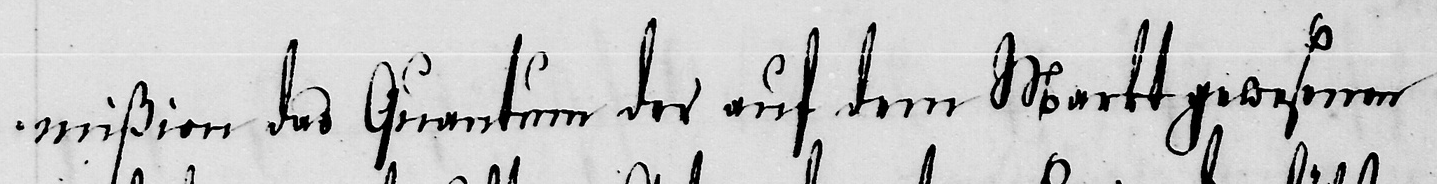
mißion das Quantum der auf dem Markt gewesenen
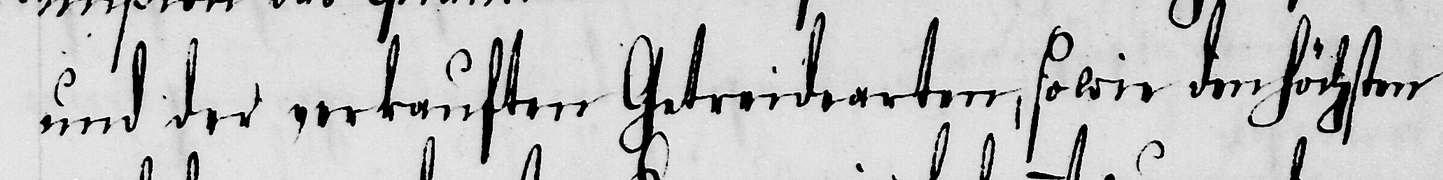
und der verkauften Getreidearten, sowie den höchsten
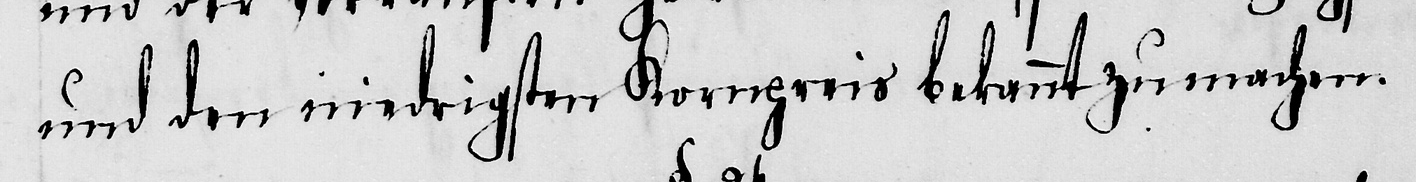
und den niedrigsten Kornpreis bekannt zu machen.
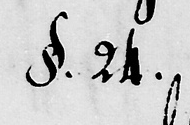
§.24.
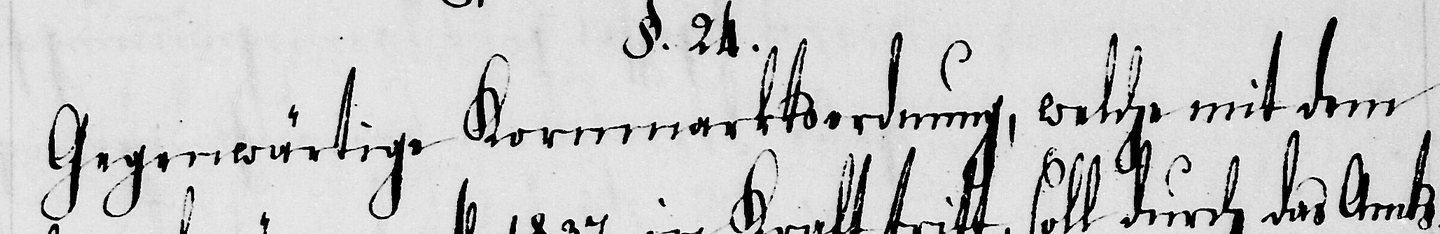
Gegenwärtige Kornmarktsordnung, welche mit dem
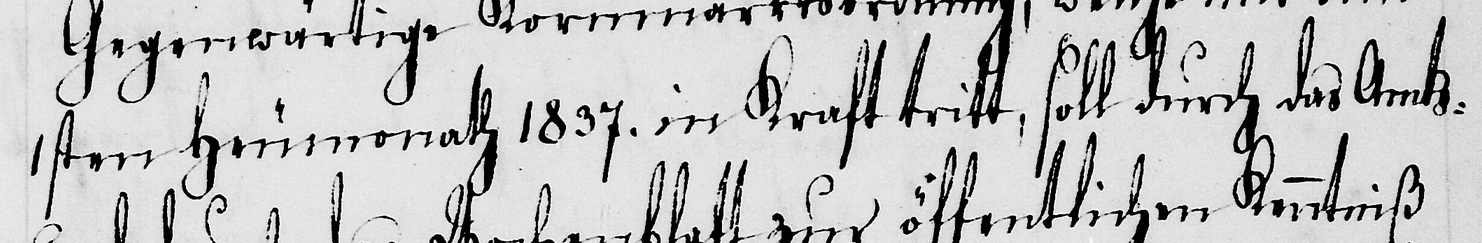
1sten Heumonath 1837. in Kraft tritt, soll durch das
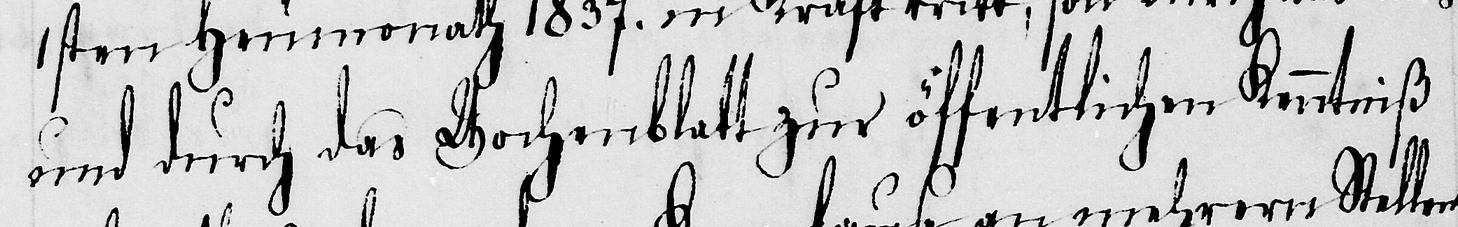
und durch das Wochenblatt zur öffentlichen Kennt¬
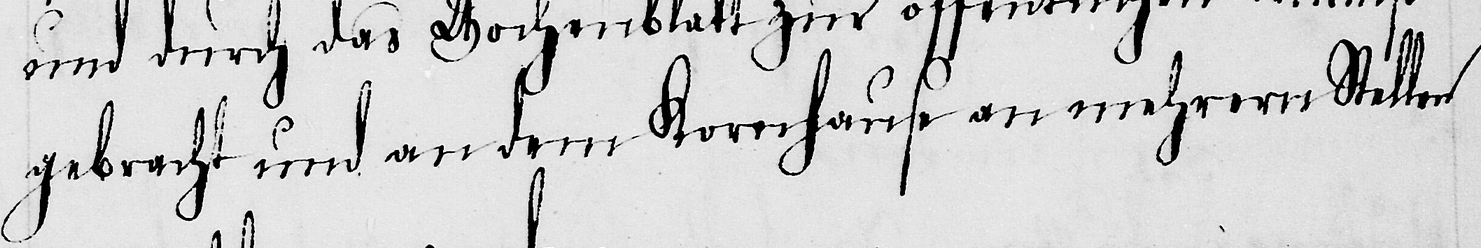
gebracht und an dem Kornhause an mehrern Stellen
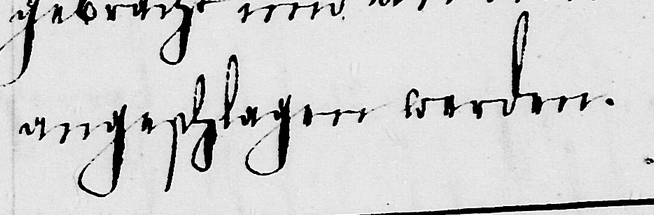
angeschlagen werden.
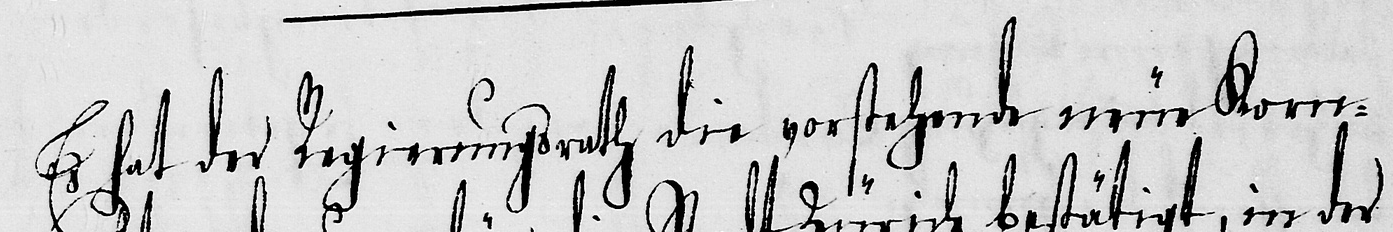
Es hat der Regierungsrath die vorstehende neue Korn¬
